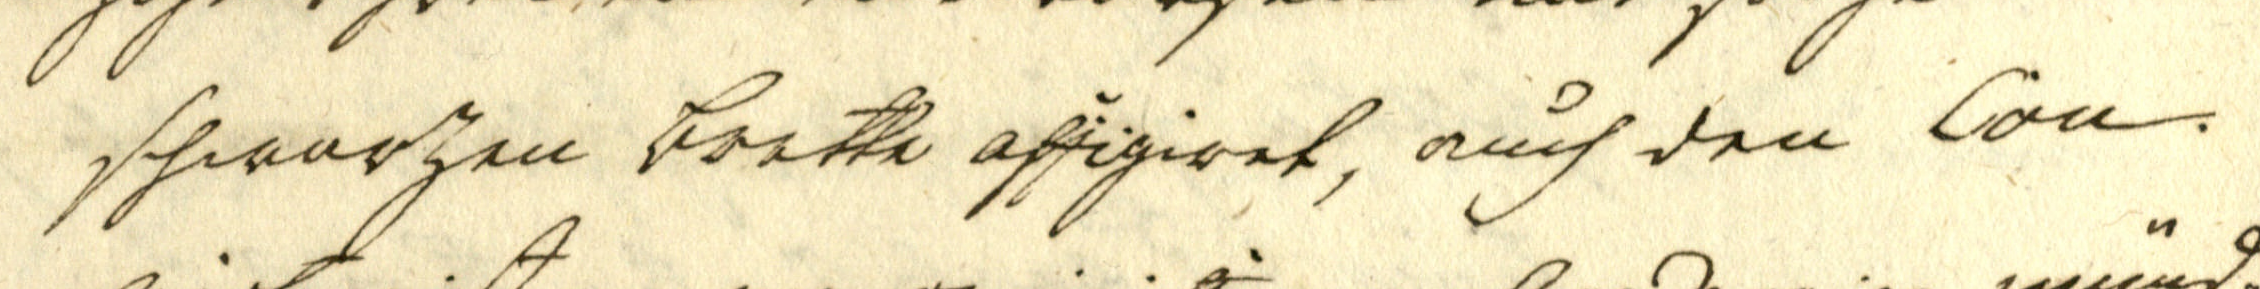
schwarzen Brette affigiret, auch den Con¬
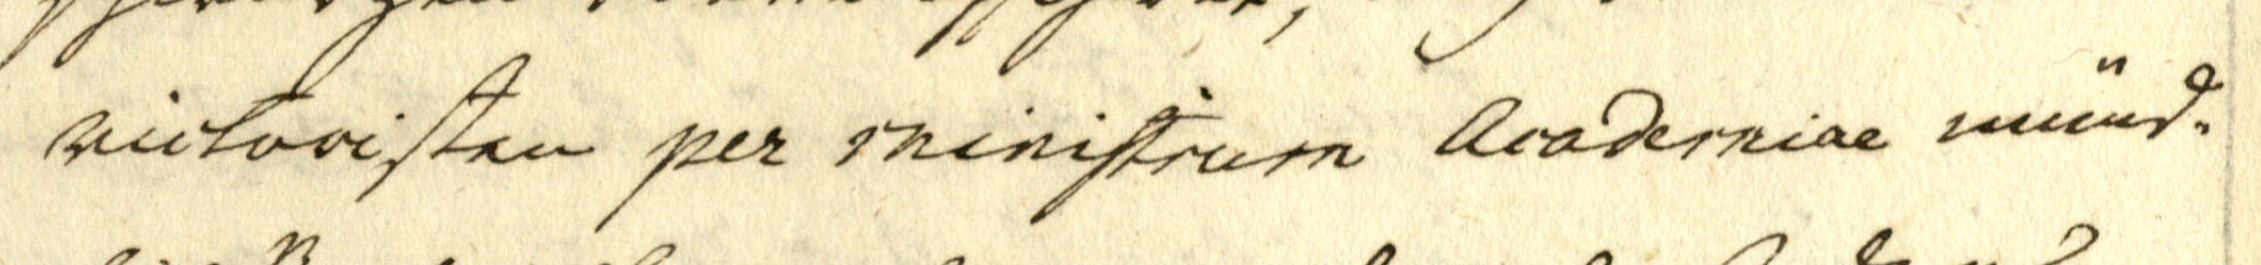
victoristen per ministrum Academiae münd¬
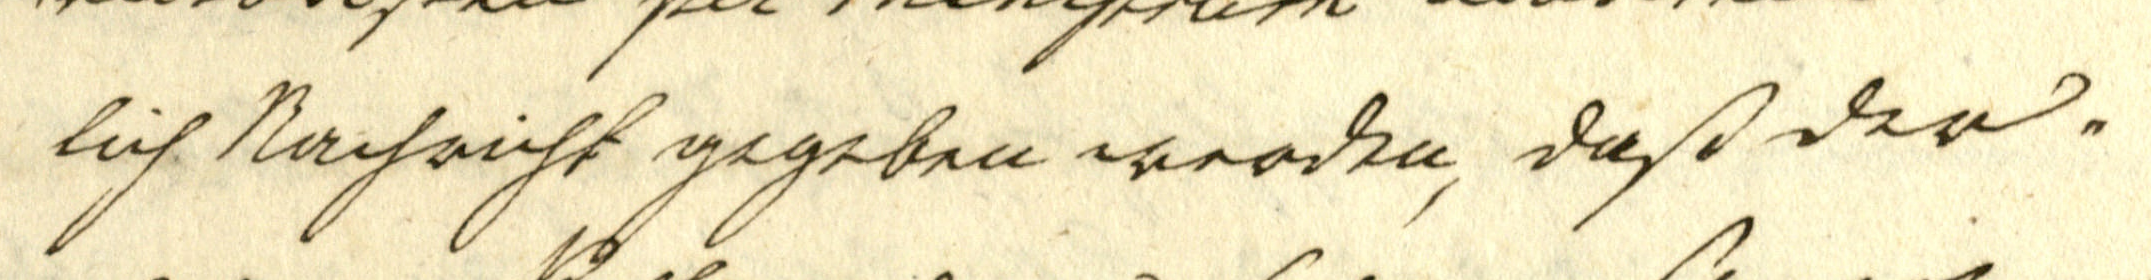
lich Nachricht gegeben werden, daß der¬
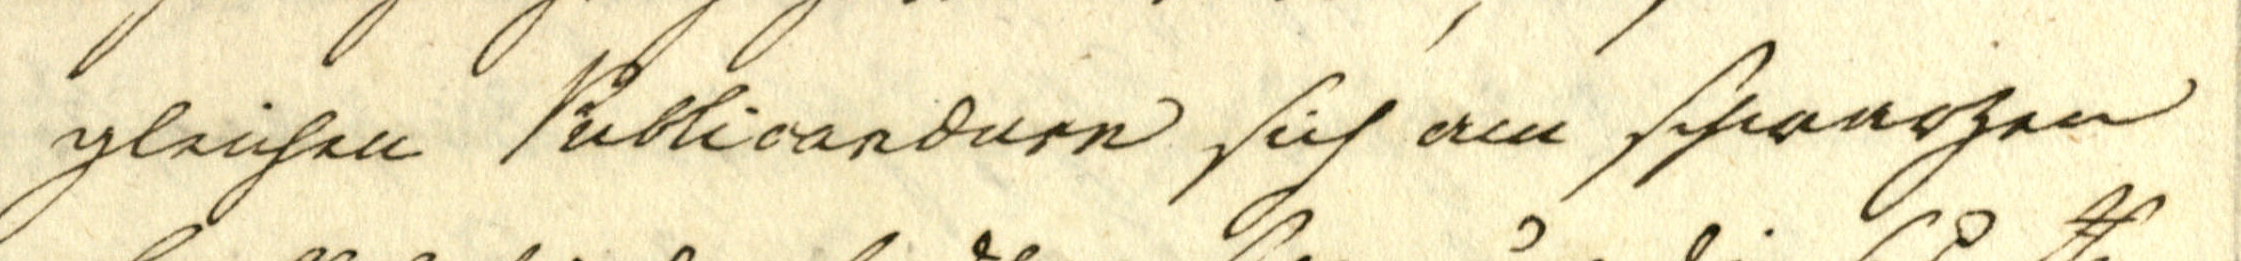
gleichen Publicandum sich am schwarzen
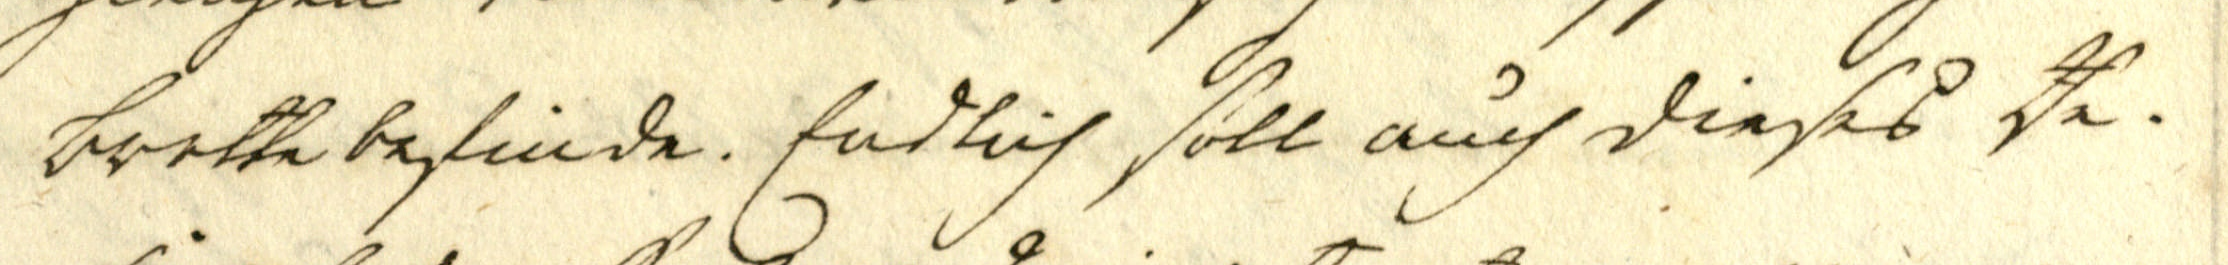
Brette befinde. Endlich soll auch dieses Re¬
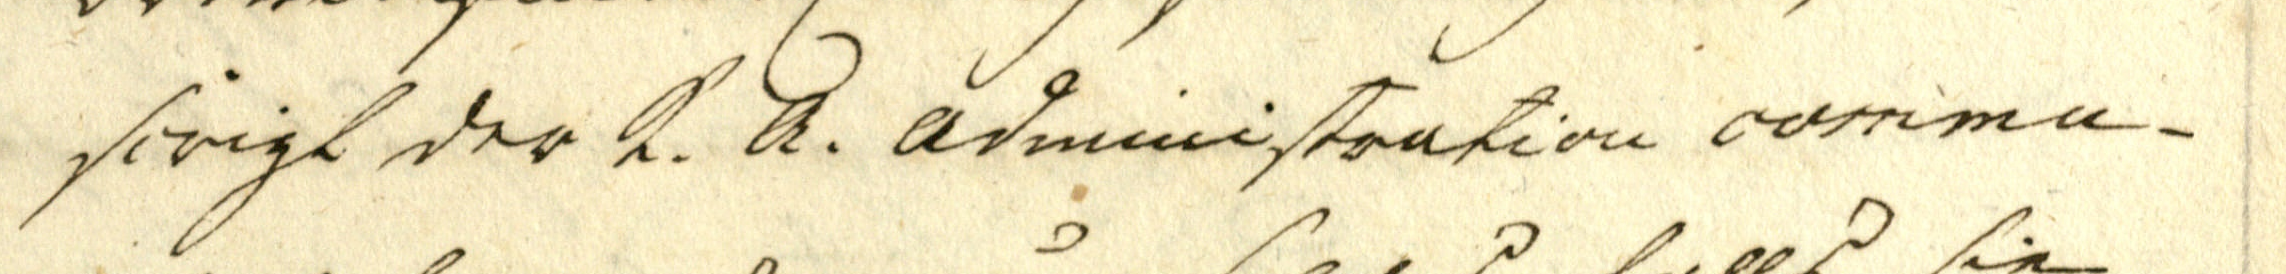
script der K. A. Administration commu¬
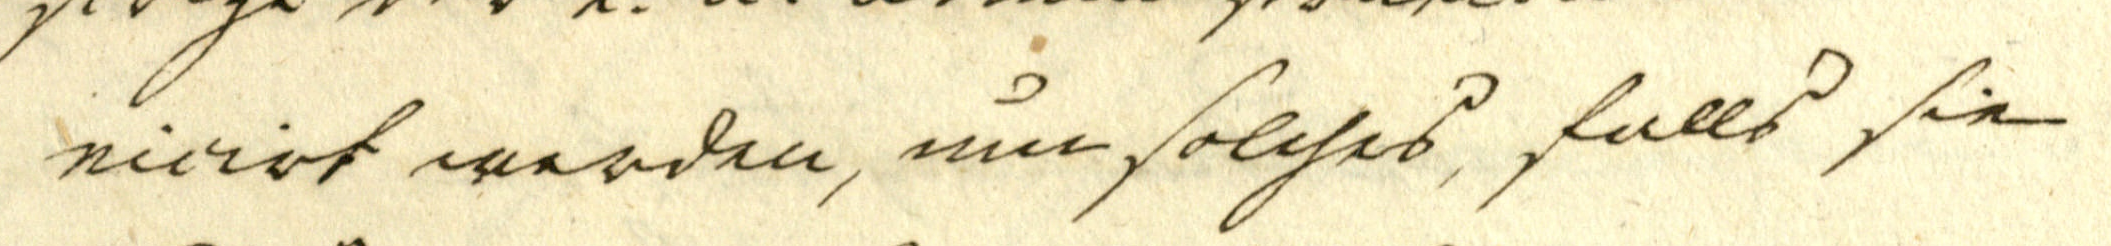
nicirt werden, um solches, falls sie
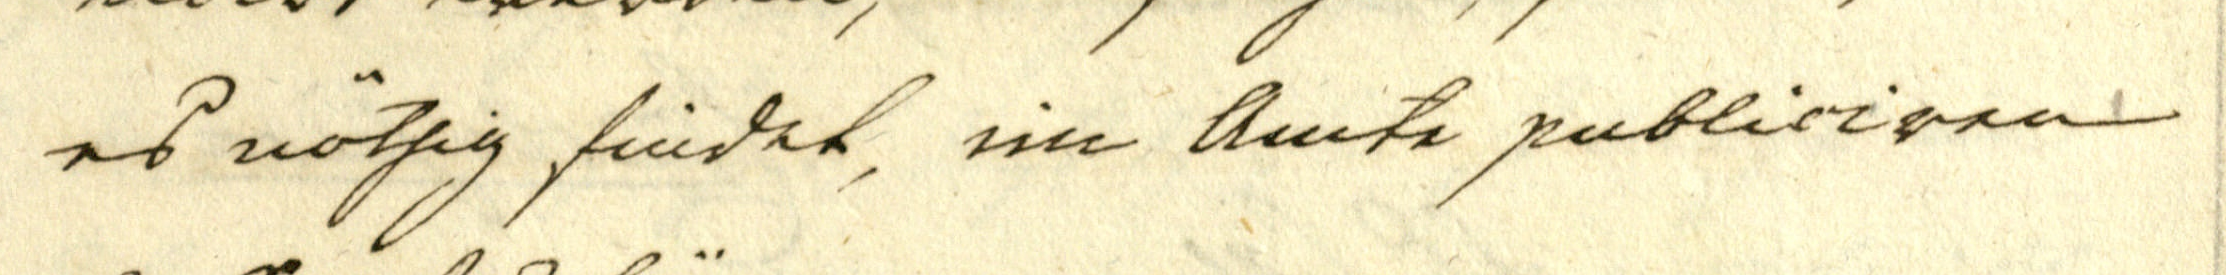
es nöthig findet, im Amte publiciren
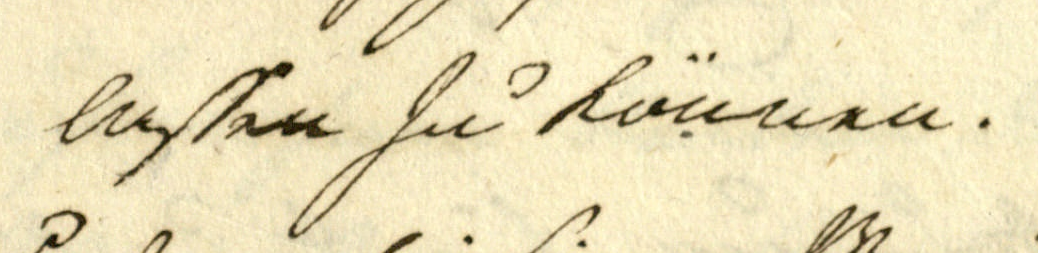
lassen zu können.
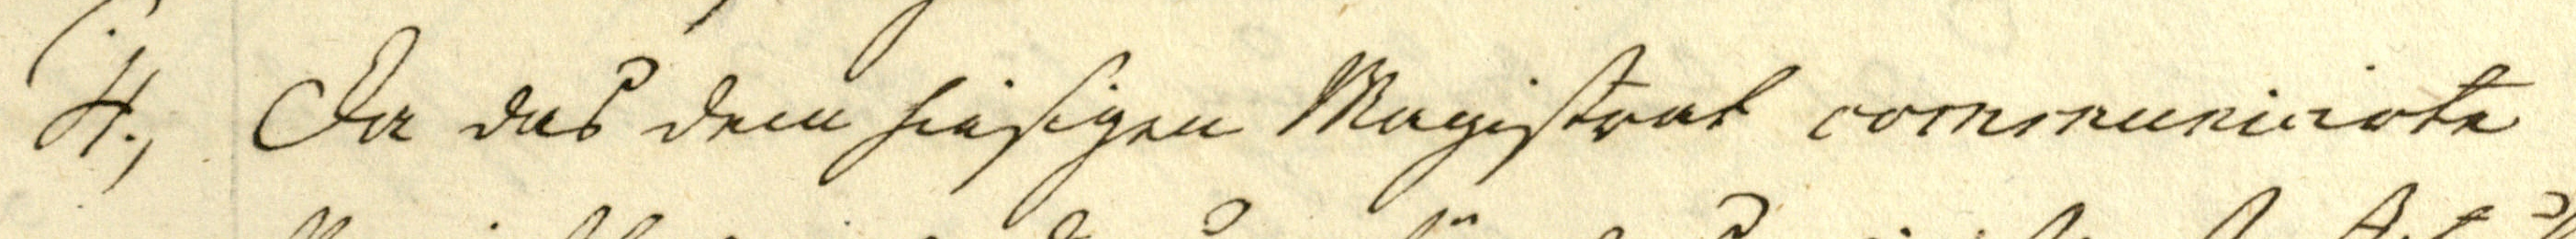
4., Da das dem hiesigen Magistrat communicirte
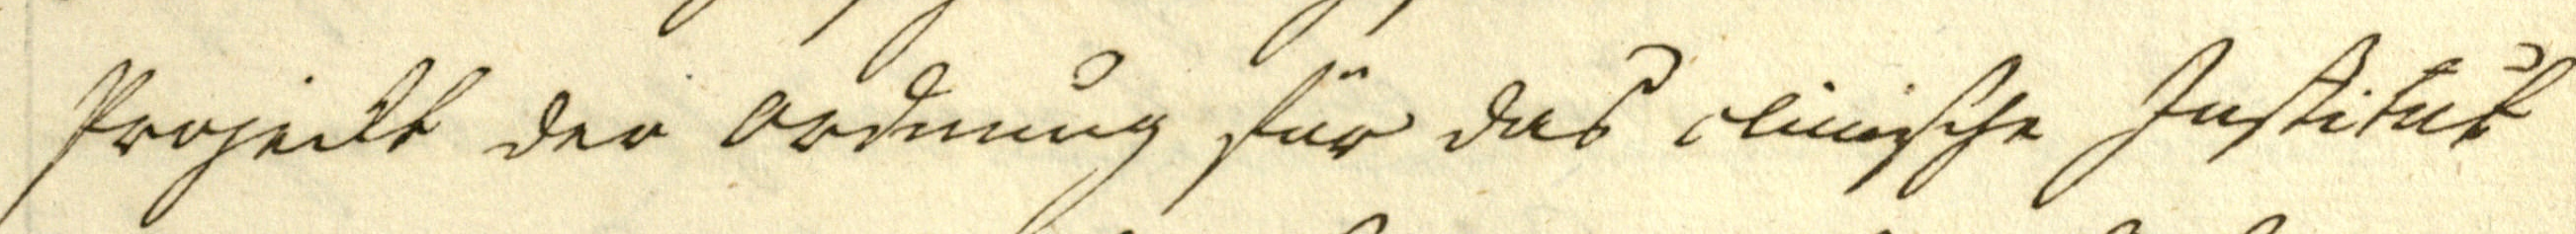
Projeckt der Ordnung für das clinische Institut
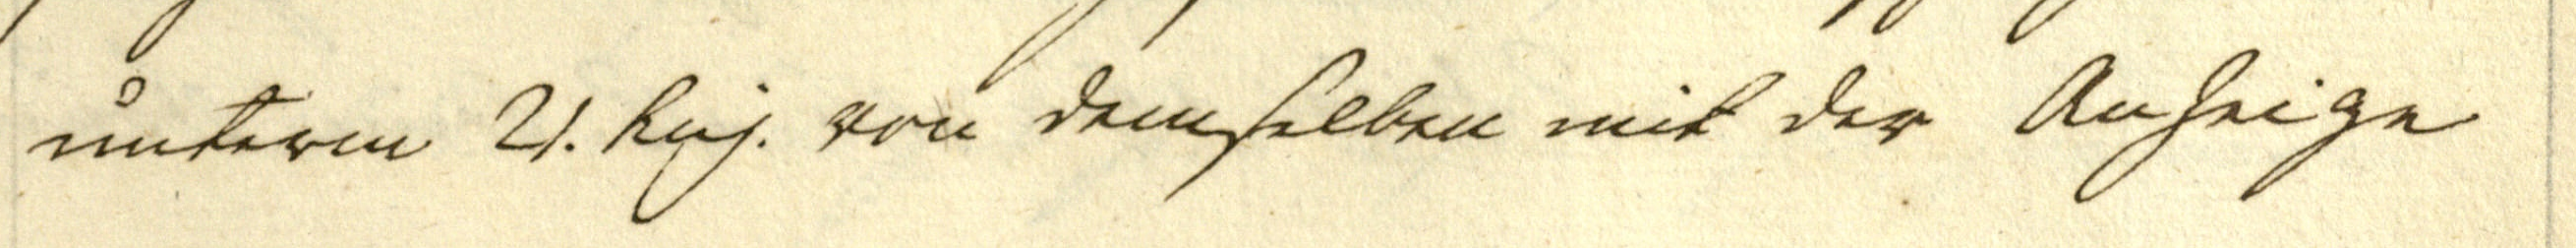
unterm 21. huj. von demselben mit der Anzeige
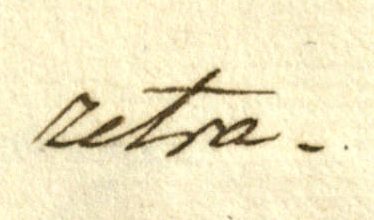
retra-
